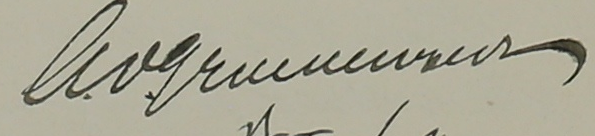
A.v.Gruenewaldt
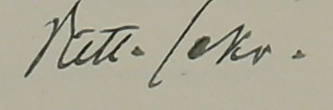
Ritt. Sekr.
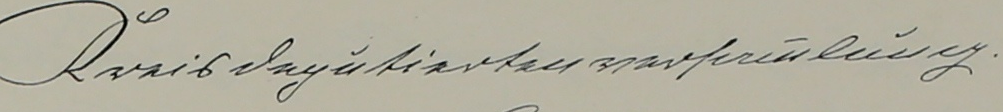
Kreisdeputiertenversammlung
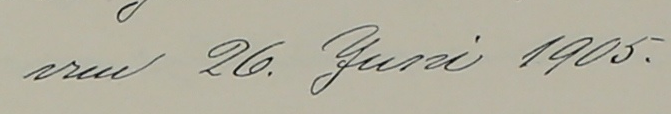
am 26. Juni 1905.
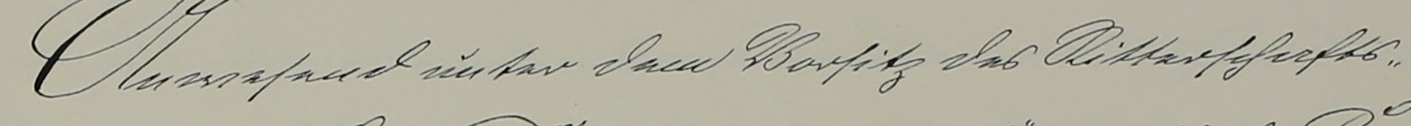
Anwesend unter dem Vorsitz des Ritterschafts-
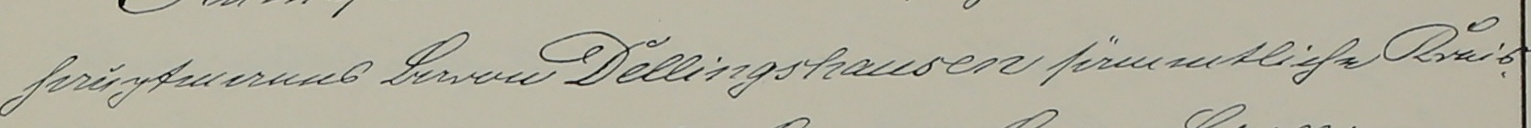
hauptmanns Baron Dellingshausen sämmtliche Kreis-
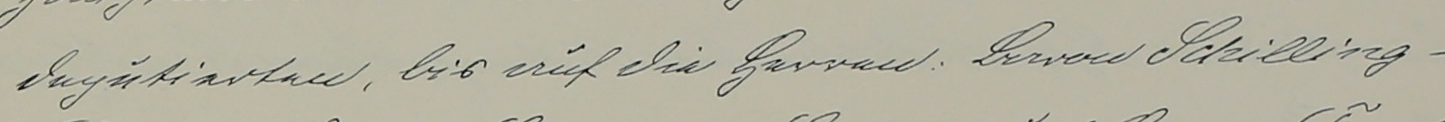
deputierten, bis auf die Herren: Baron Schilling-
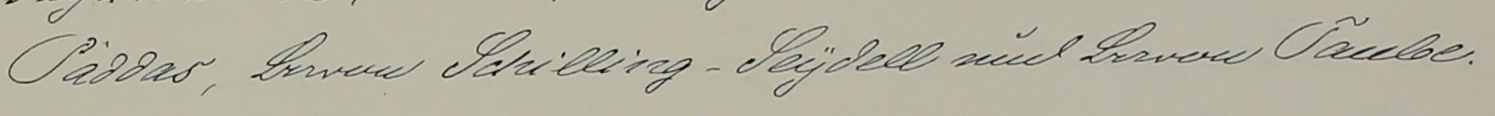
Paddas, Baron Schilling-Seydell und Baron Taube.
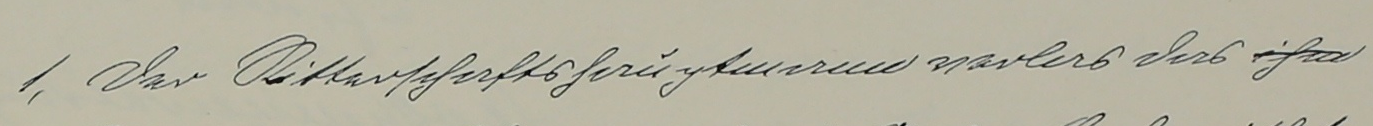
1. Der Ritterschaftshauptmann verlas das ihm
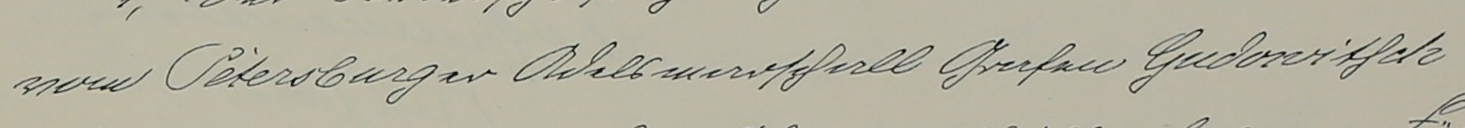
vom Petersburger Adelsmarschall Grafen Gudowitsch
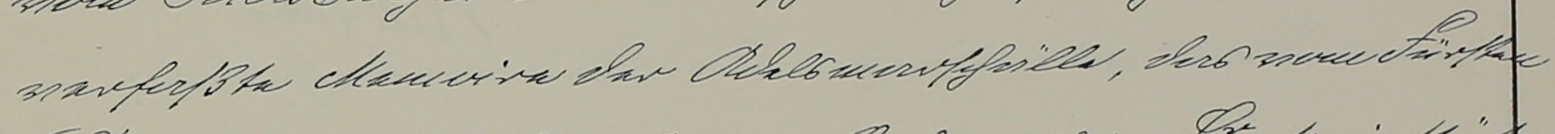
verfaßte Memoire der Adelsmarschälle, das vom Fürsten
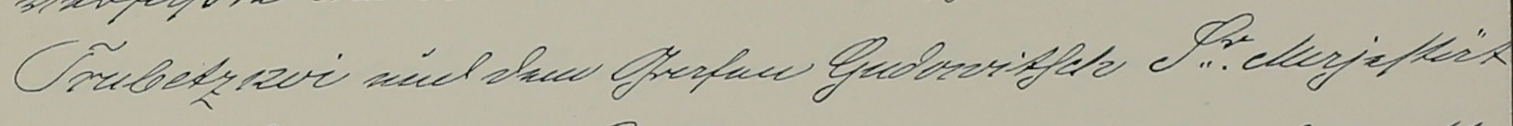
Trubetzkoi und dem Grafen Gudowitsch Sr. Majestät
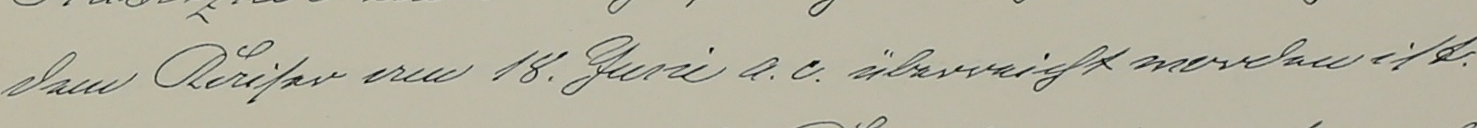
dem Kaiser am 18. Juni a.c. überreicht worden ist.
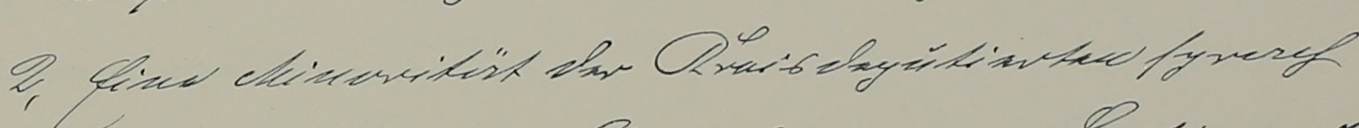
2. Eine Minorität der Kreisdeputierten sprach
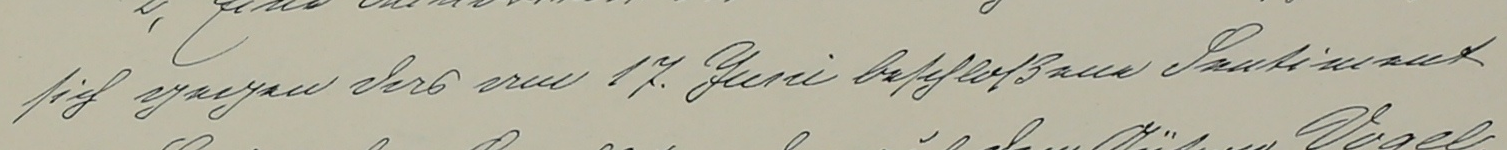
sich gegen das am 17. Juni beschloßene Sentiment
